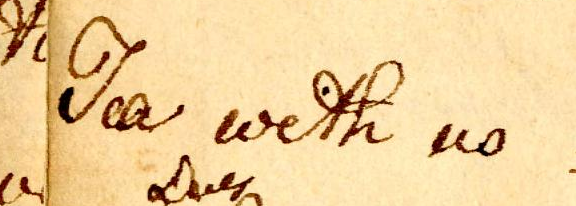Tea with us
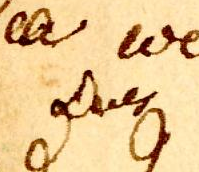Day
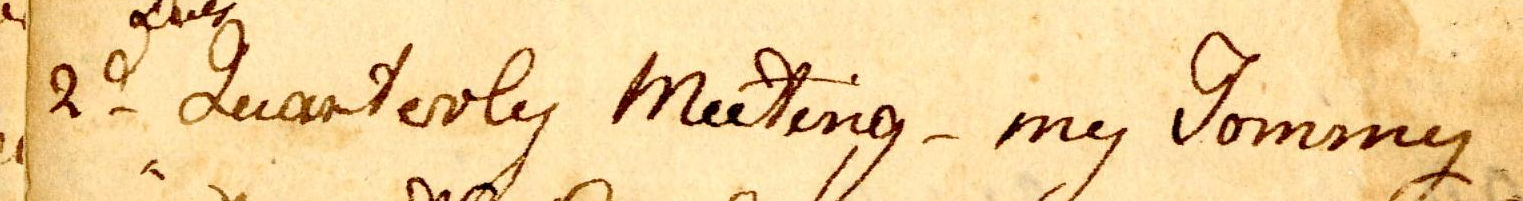2^d Quarterly Meeting- my Tommy
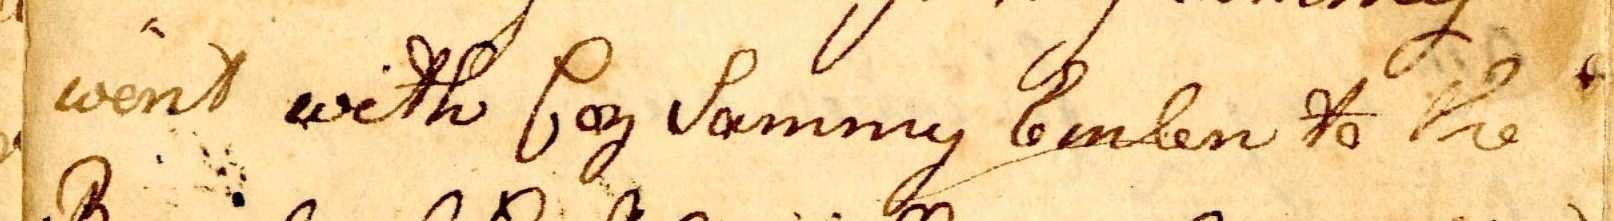went with Coz Sammy Emlen to the
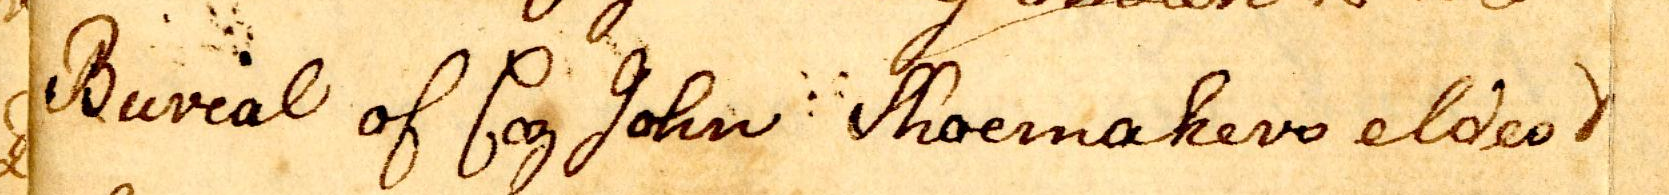Burial of Coz John Shoemakers eldest
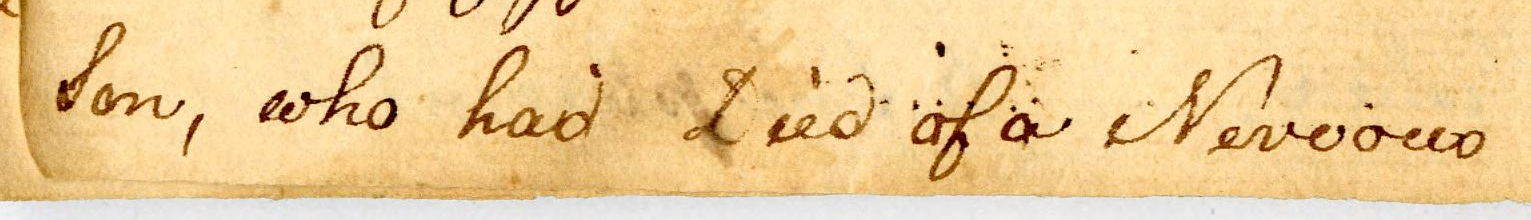Son, who had Died of a Nervous
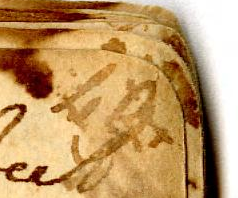49
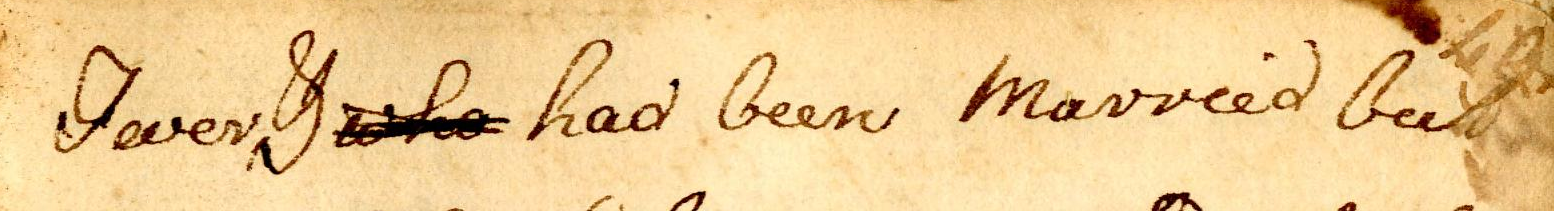Fever & who had been Married but
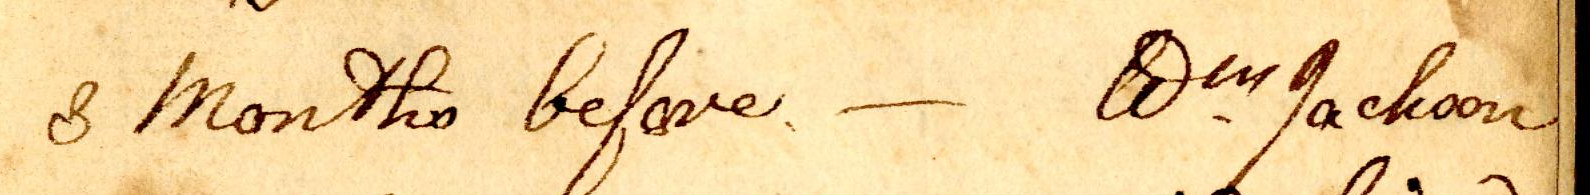8 Months before- W^m Jackson
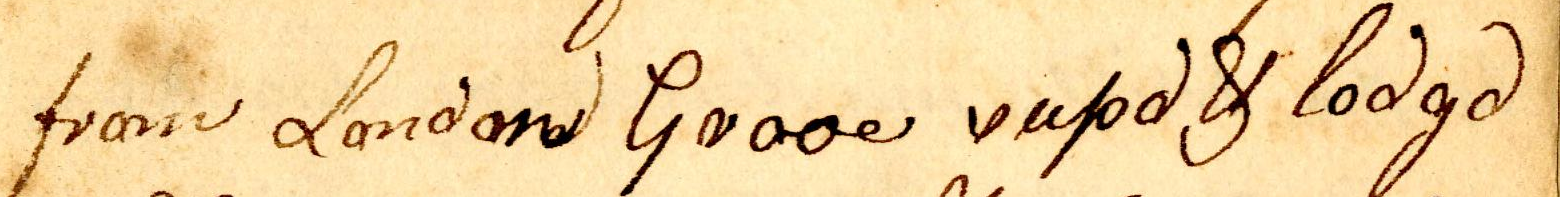from London Grove supd & lodgd
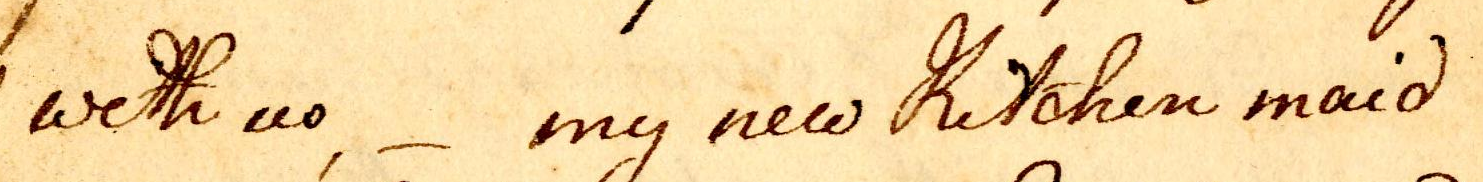with us,- my new Kitchen maid
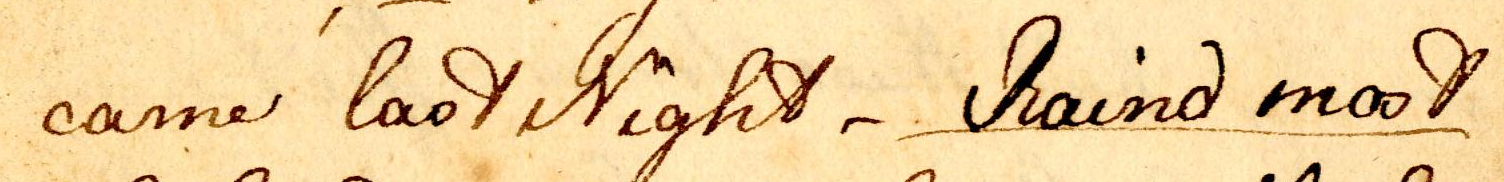came last Night- Raind most
